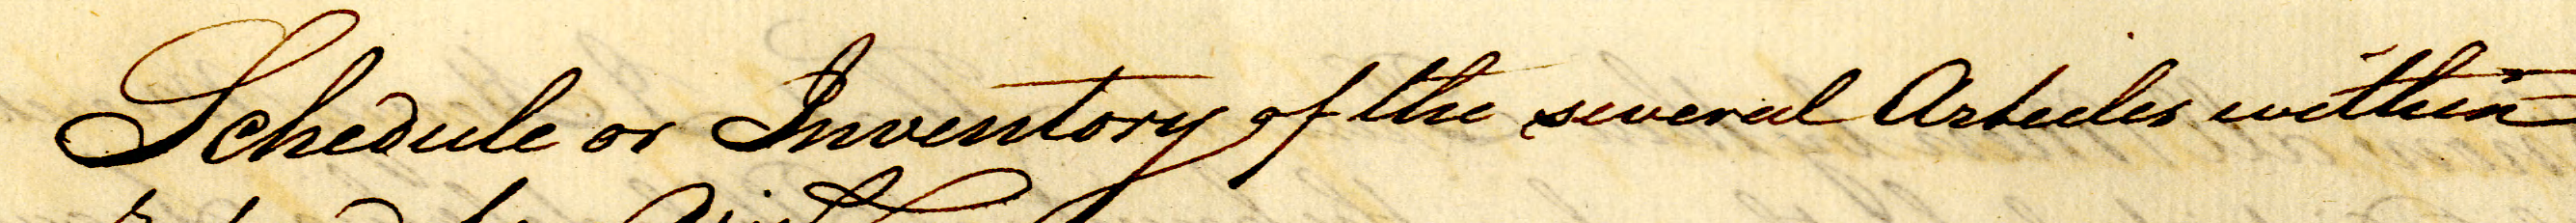Schedule or Inventory of the several Articles within
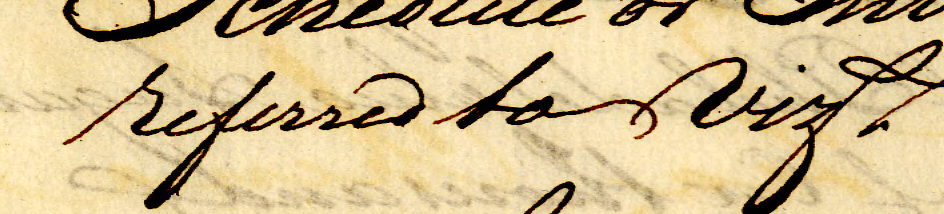reffered to Viz^t.
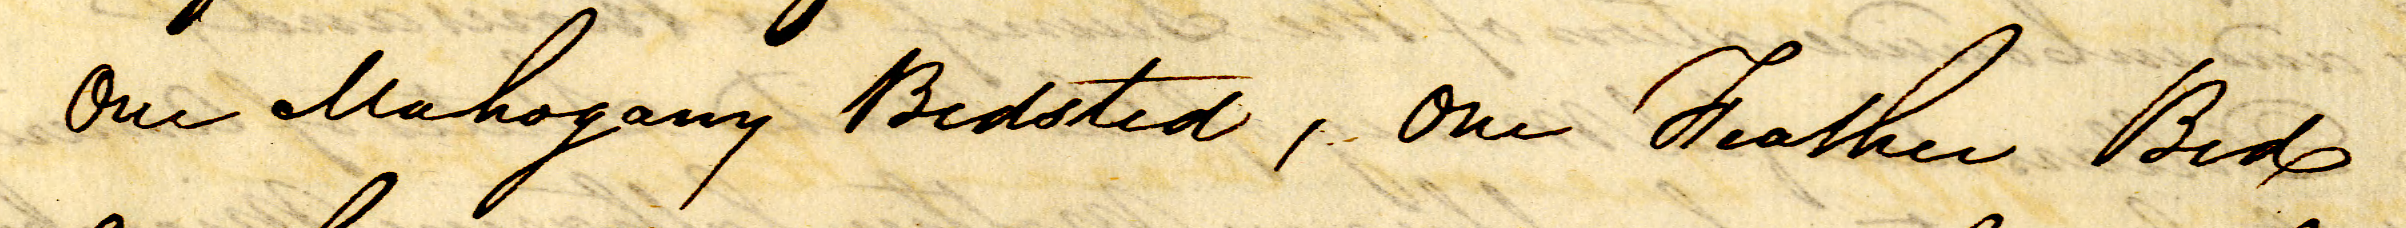One Mahogany Bedsted, one Feather Bed
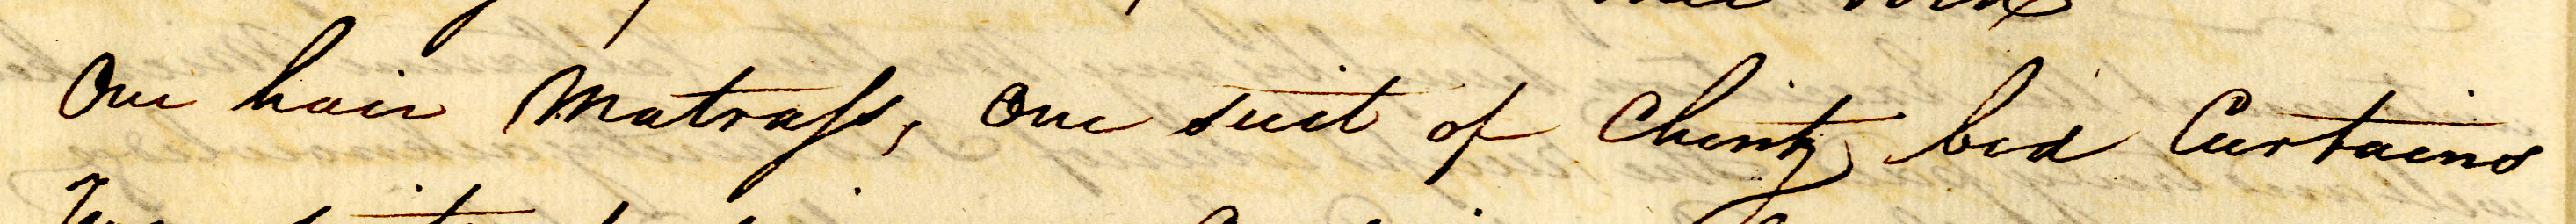One hair Matress, one suit of chintz bed Curtains
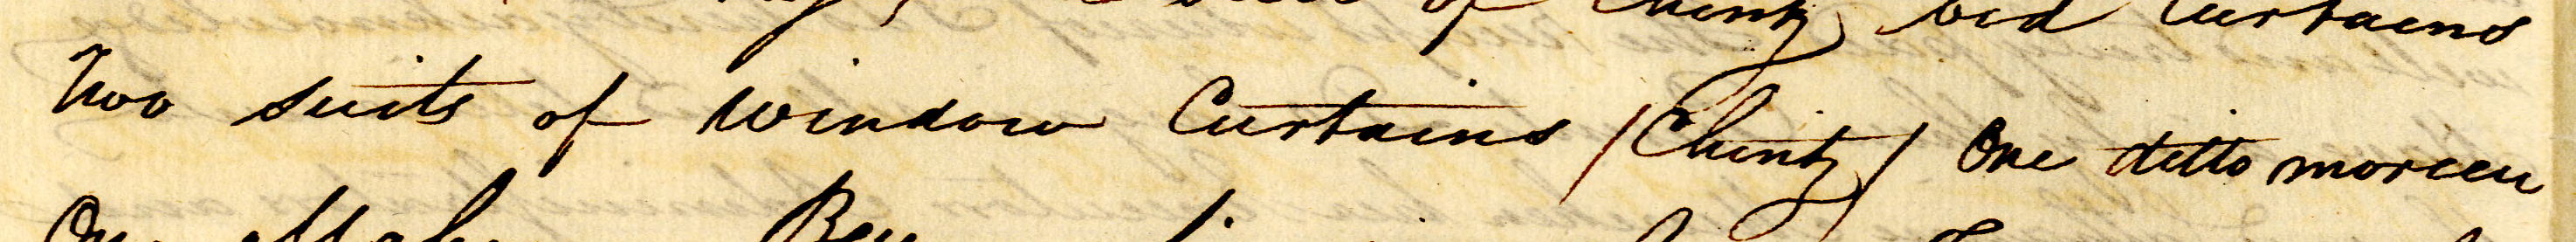Two suits of window Curtains /Chintz/ one ditto morceu
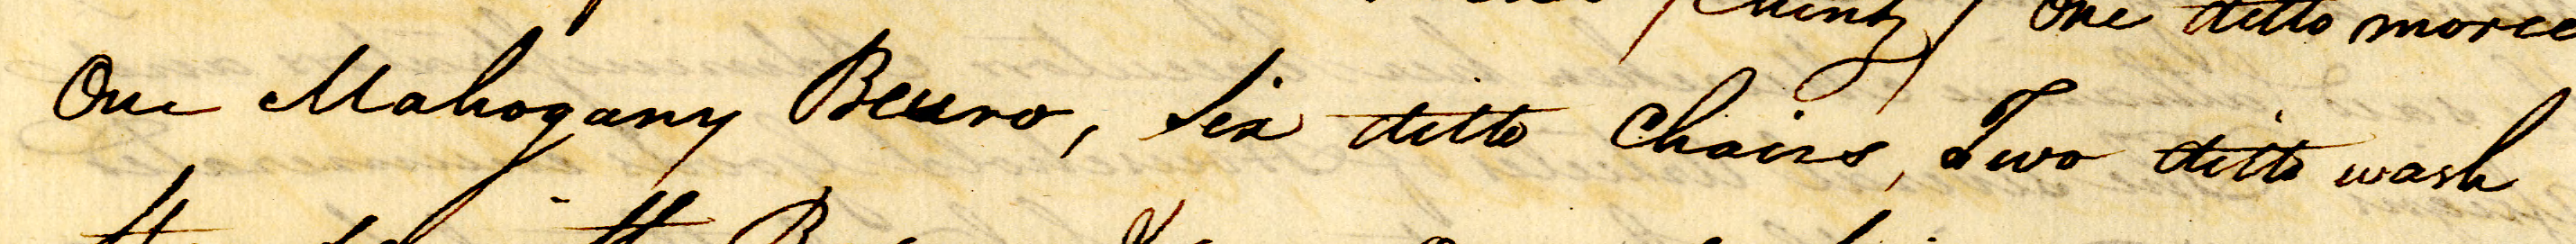One Mahogany Beuro, Six ditto chairs, two ditto wash
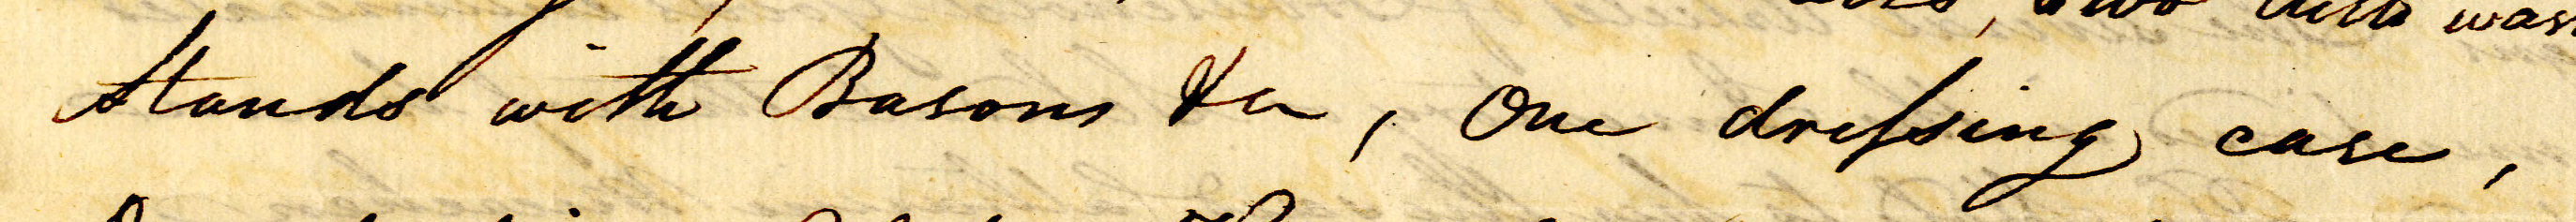Stands with Basons &c, one dressing case,
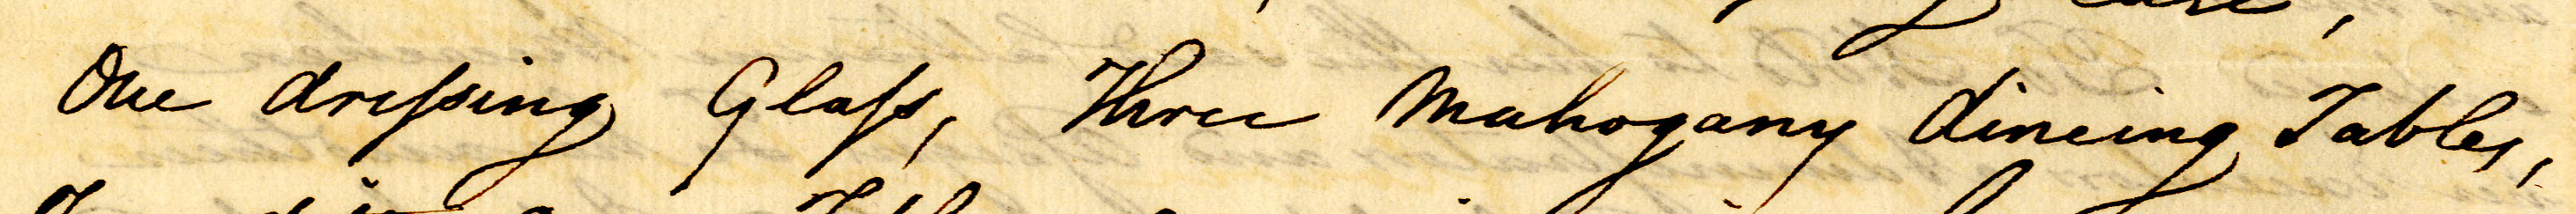one dressing Glass, Three Mahogany dining Tables,
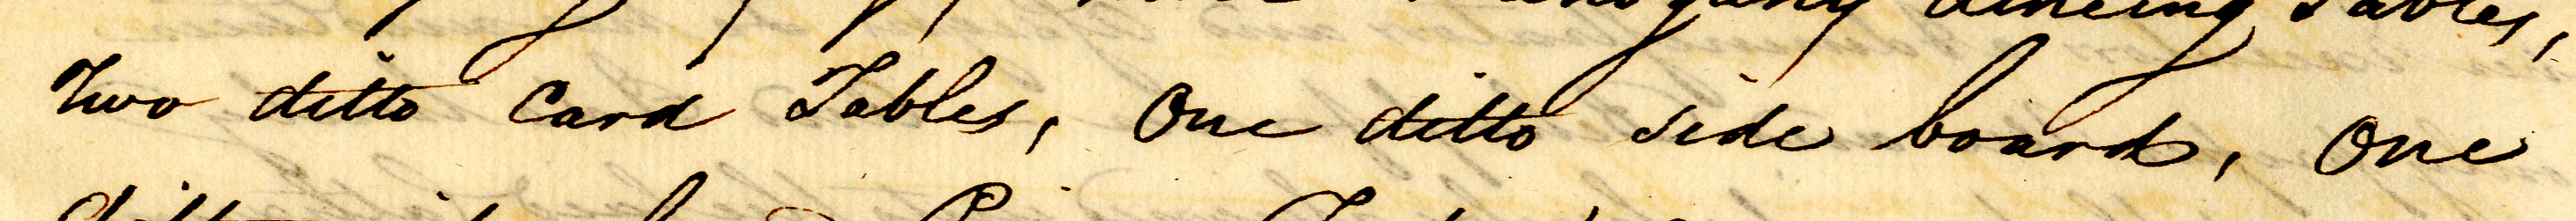Two ditto card Tables, one ditto side board, one
